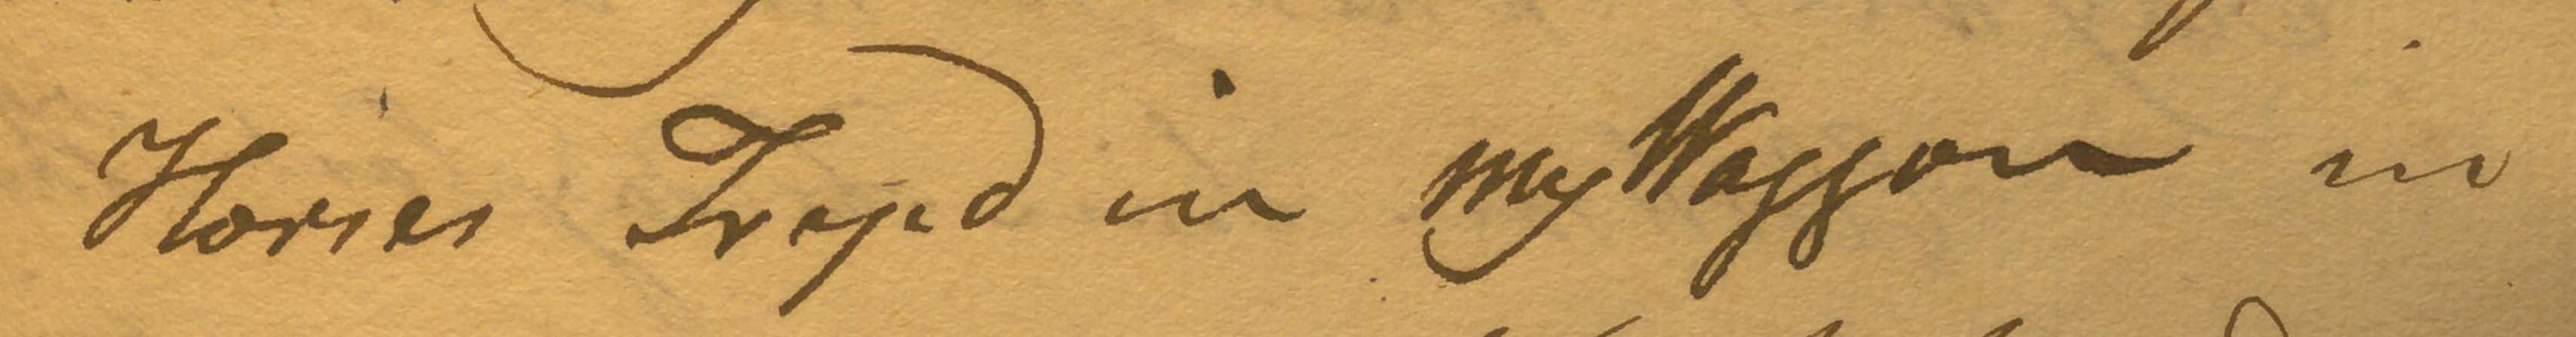Horses Tryed in My Waggon in
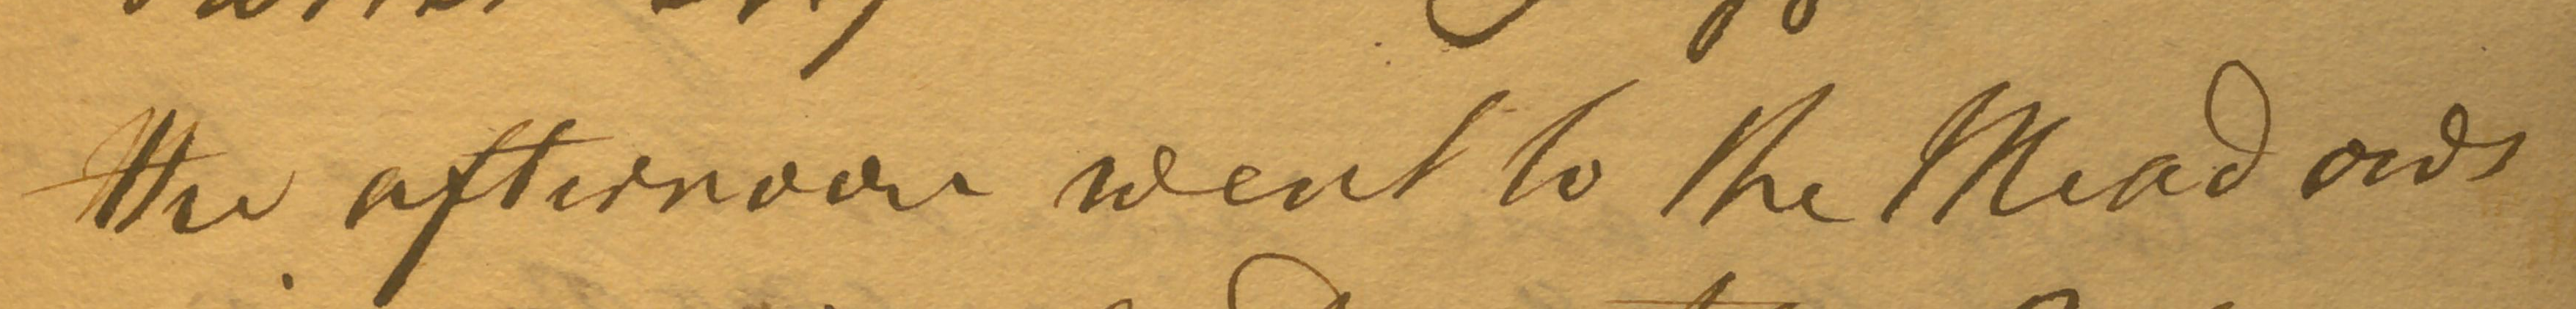the afternoon went to the Meadows
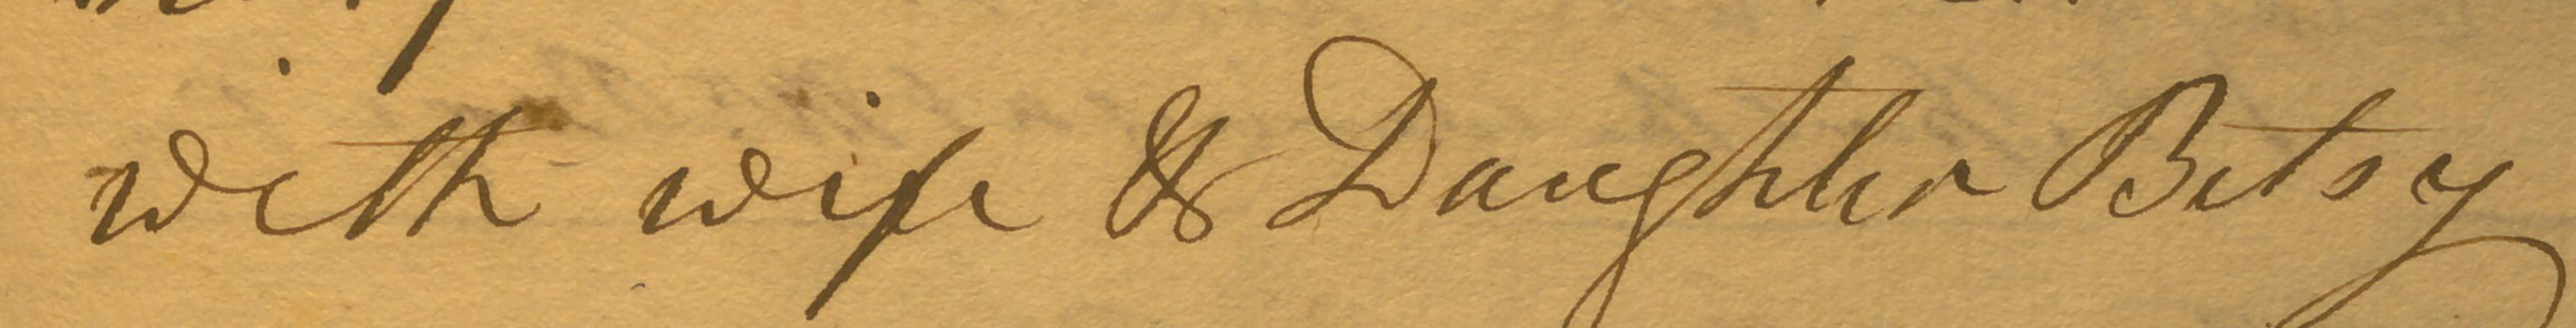with wife & Daughter Betsy
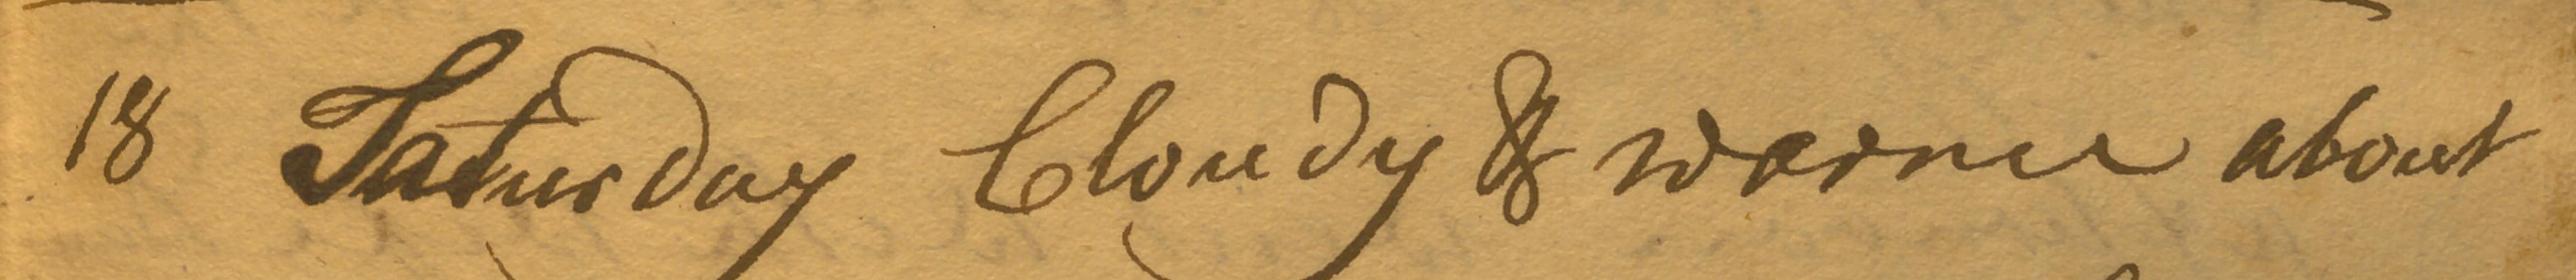18 Saturday Cloudy & warme about
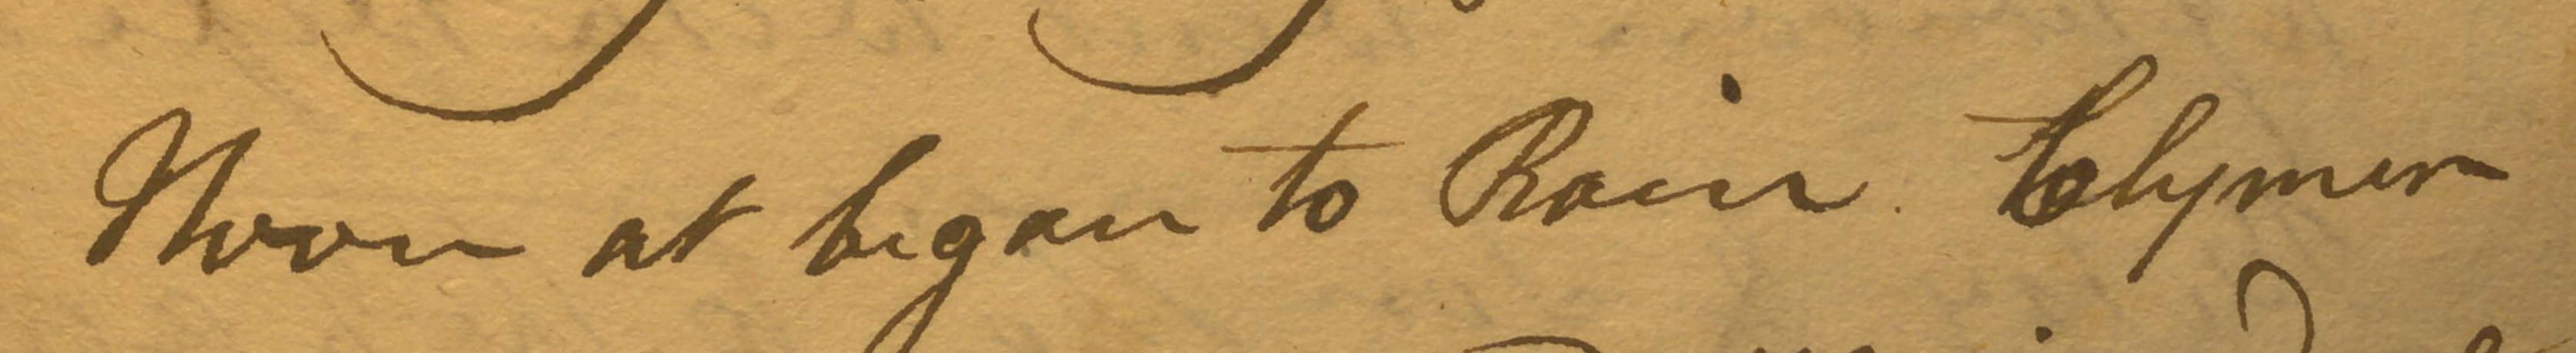Noon at began to Rain. Clymer
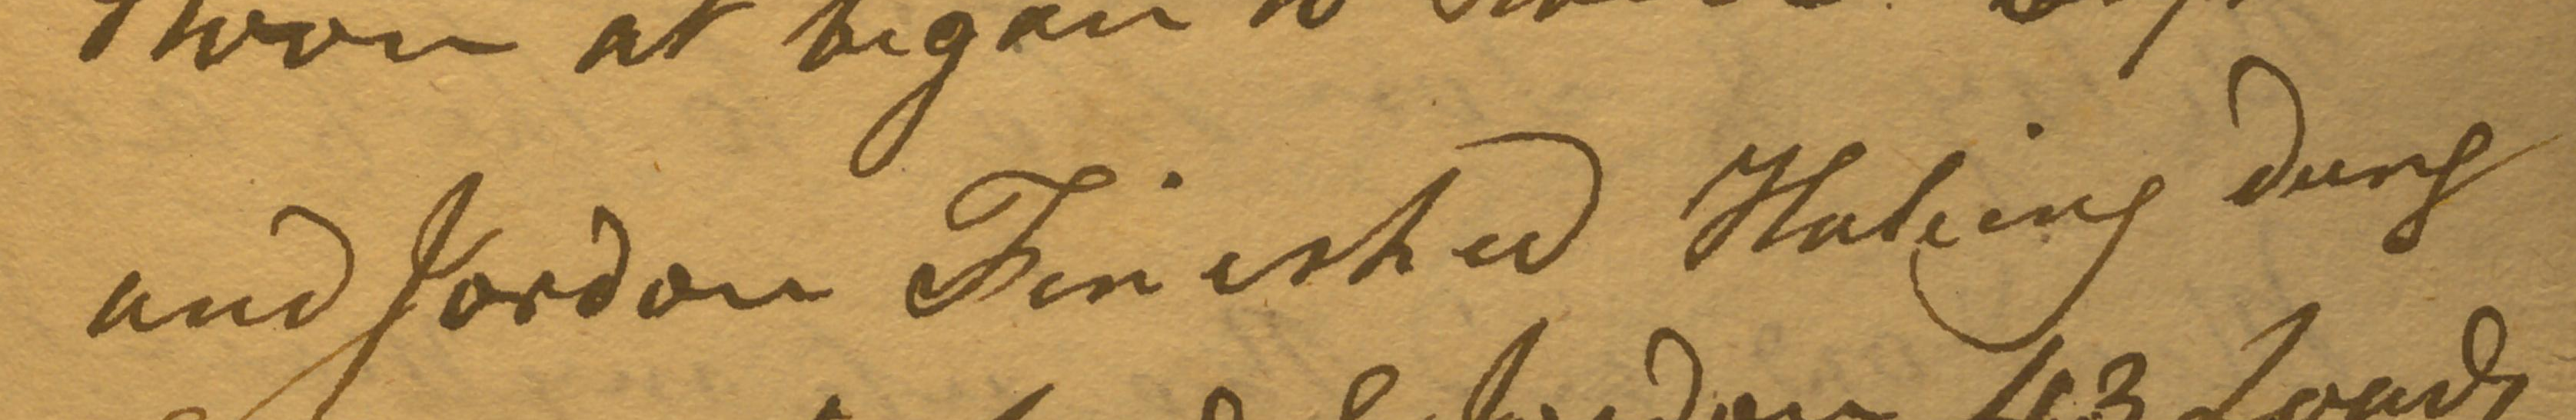and Jordon Finished Haling dung
